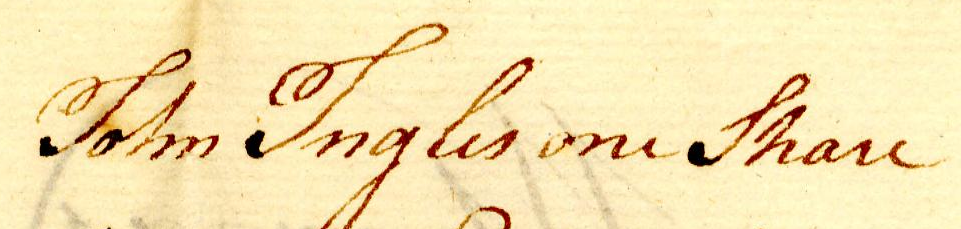Jom Ingles one Share
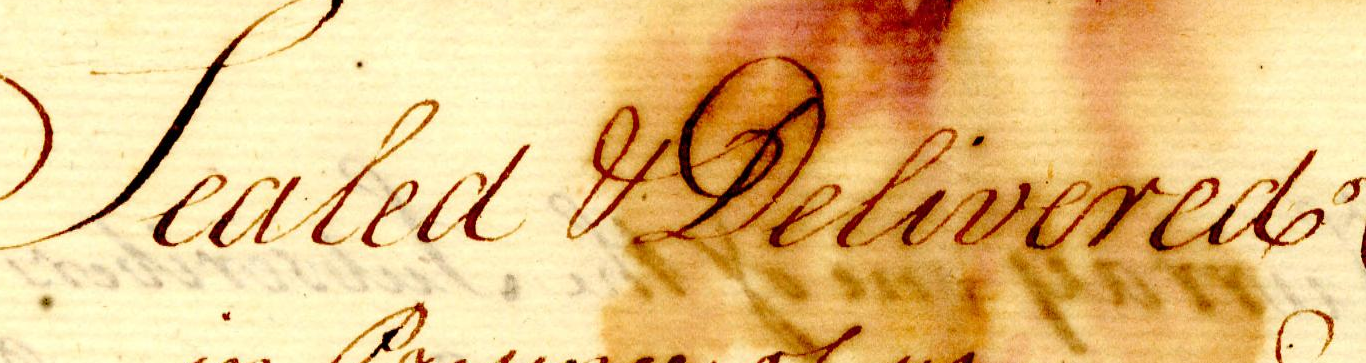Sealed & Delivered
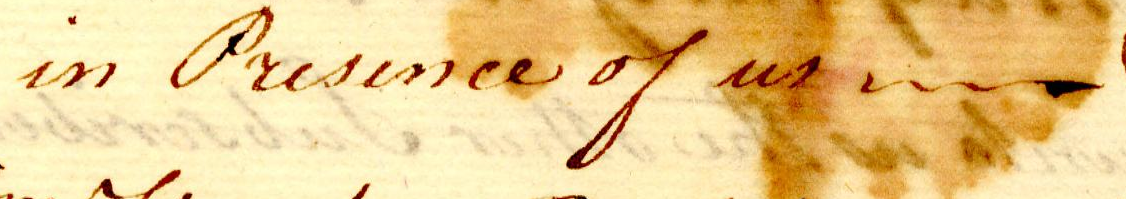in Presence of us
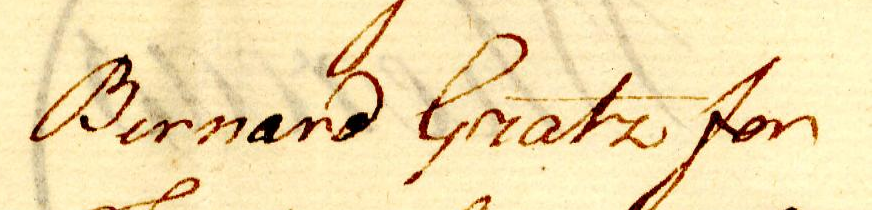Bernard Gratz for
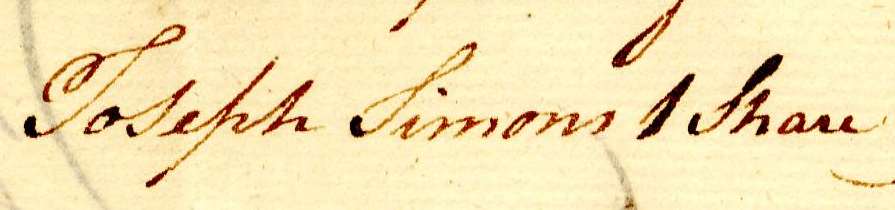Joseph Simons 1 Shave
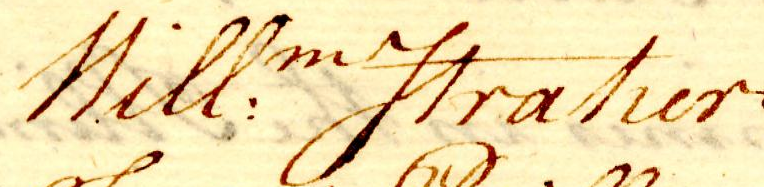Will^m: Straker
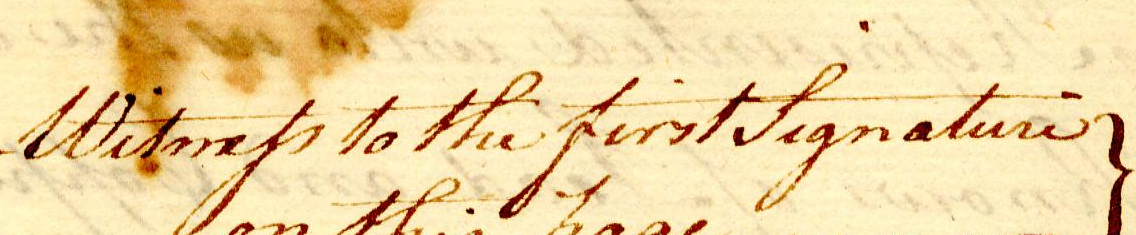Witness to the first Signature
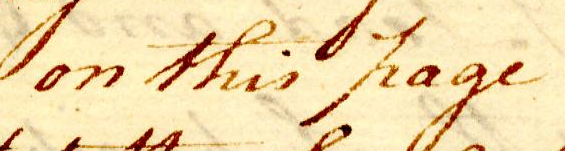on this page
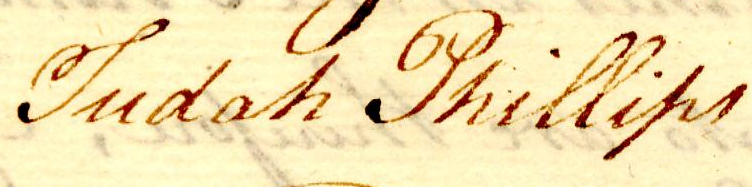Judah Phillips
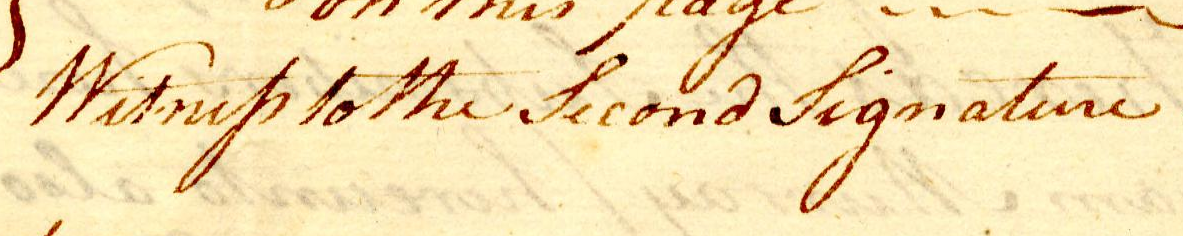Witness to the Second Signature
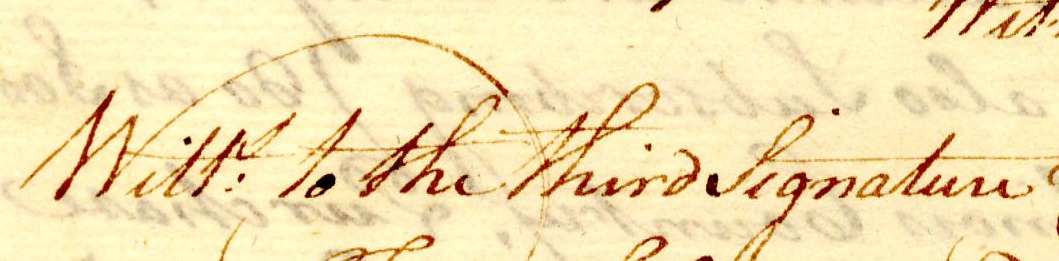Witt^s. to the third Signature
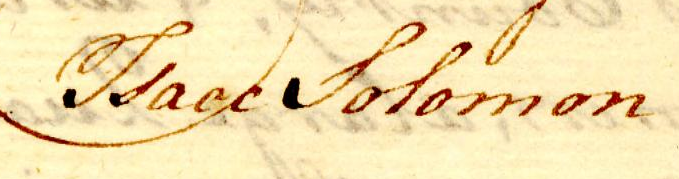Isaac Solomon
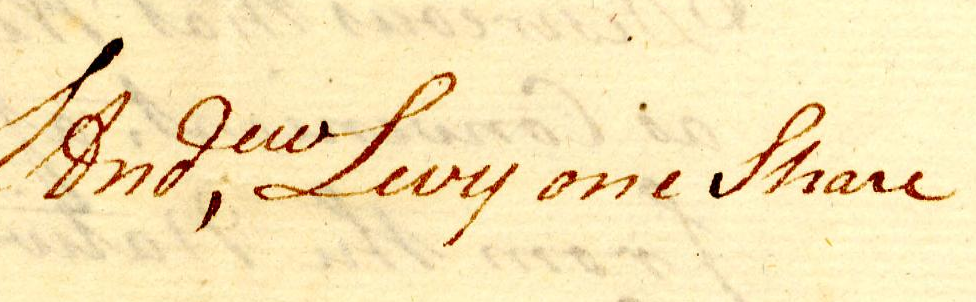And^rew Levy one Share
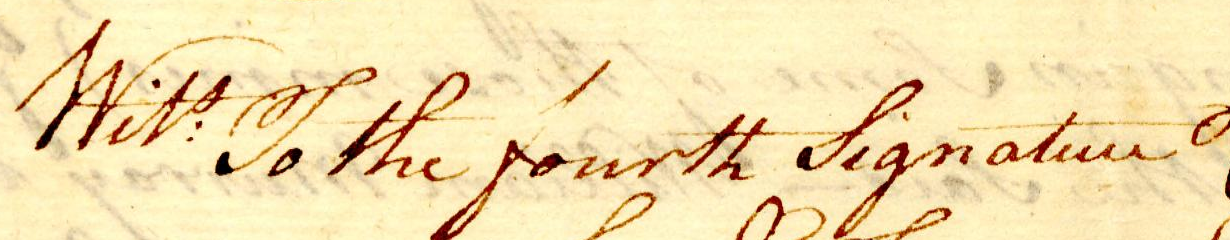Wit^s. To the fourth Signature
